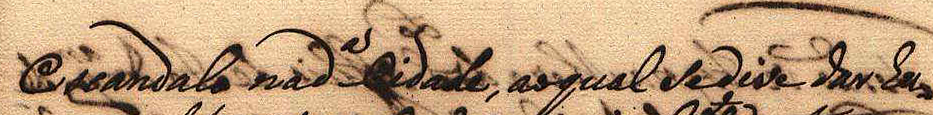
Escandalo na d.a Cidade, ao qual se deve dar hu
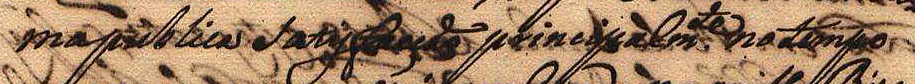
ma publica satisfacçaõ principalm.te no tempo
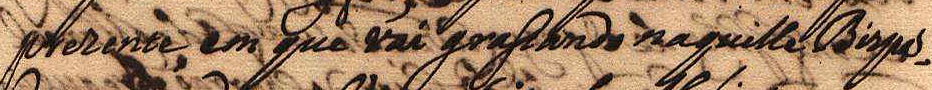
prezente, em que vai grassando naquelle Bispa
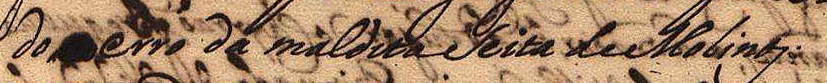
do _ erro da maldita seita de Molinos.
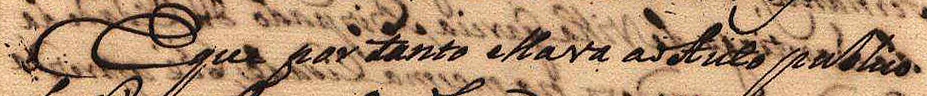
E que portanto ella va ao Auto publico
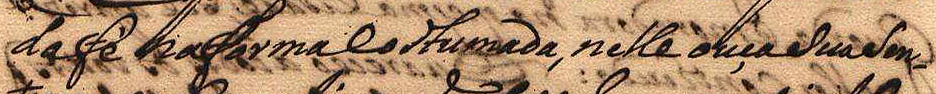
da fé na forma costumada, nelle ouça Sua sen
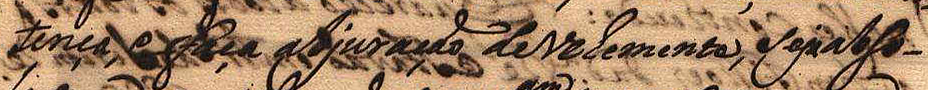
tença, e faça abjuraçaõ de vehemente, seja abso
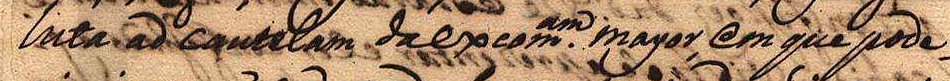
luta ad. cautelam da excom.am mayor, em que pode
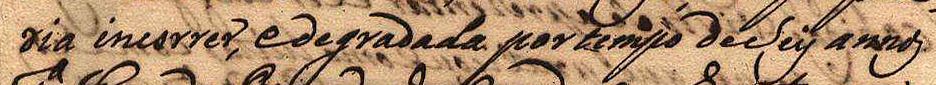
ria incorrer, e degradada por tempo de seis annos
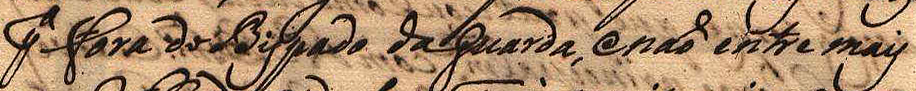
p.a fora do Bispado da Guarda, e naõ entre mais
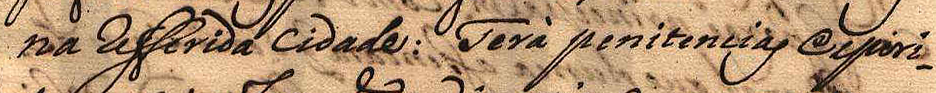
na Refferida cidade: Terà penitencias espiri
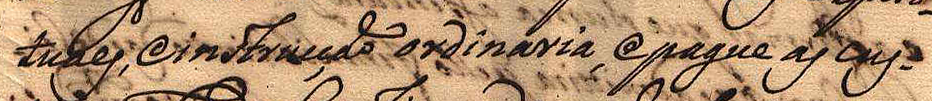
tuaes, e instrucção ordinaria, e pague as cus
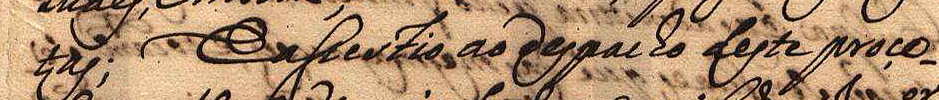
tas; E assistio ao despacho deste proce
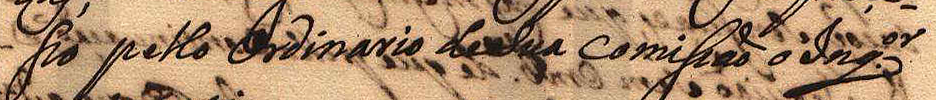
sso pello Ordinario de Sua comissaõ o Inq.or
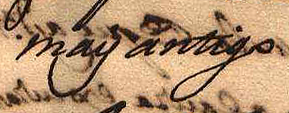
mais antigo.
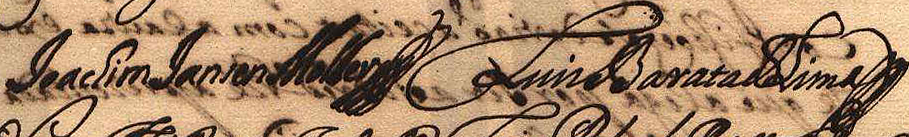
Ioachim Iansen Moller Luiz Barata de Lima
